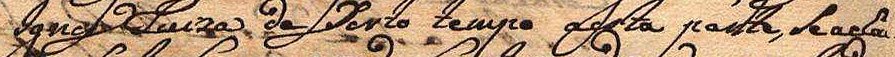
Ignes Luiza de serto tempo a esta parte, se achou
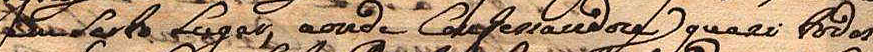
em serto Lugar, aonde Confessandoce quazi todos
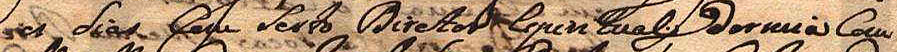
os dias Com serto Diretor Espiritual dormia Com
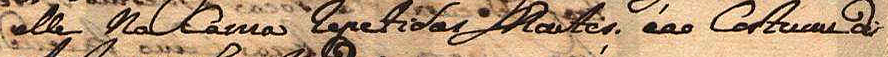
elle Na Cama Repetidas Noites; e ao Costume di
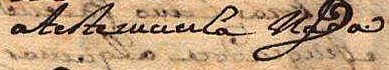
a testemunha Nada.
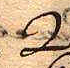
2
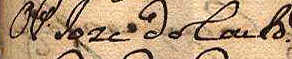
O P. Ioze do Couto
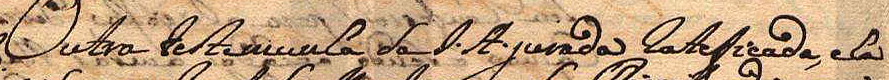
Outra testemunha de S. A. jurada Rateficada, e ha
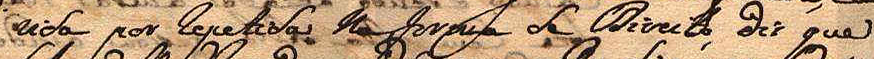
vida por Repetida na forma de Direito, dis que
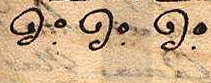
d.o d.o d.o
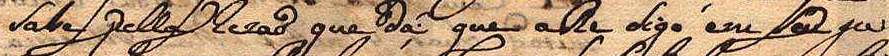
sabe pella Rezaõ que dá; que a Re digo em seu ju
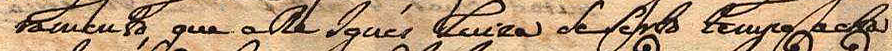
ramento, que a Re Ignes Luiza de Certo tempo a esta
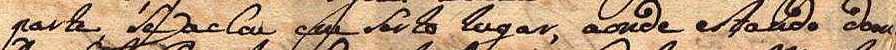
parte se achou em serto lugar, aonde estando doen
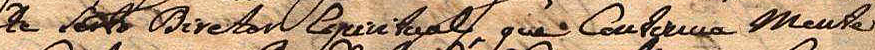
te serto Diretor Esperitual, que ComtenuaMente
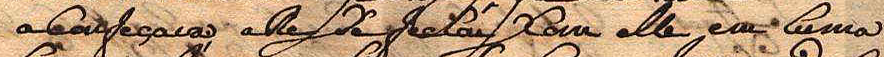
a Confeçava, a Re se achou Com elle em huma
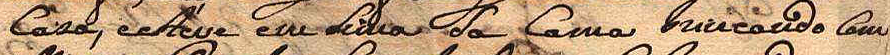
Caza, e esteve em sima da Cama brincando Com
